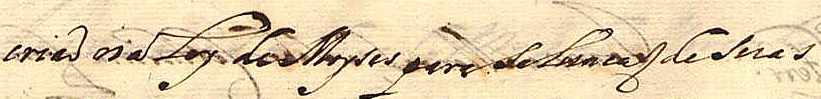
criaõ na Ley de Moyses para saluacaꝭ de suas
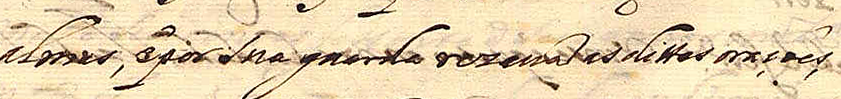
almas, e por sua guarda rezauā as dittas oraçoẽs,
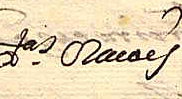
dtas. Oraçoẽs
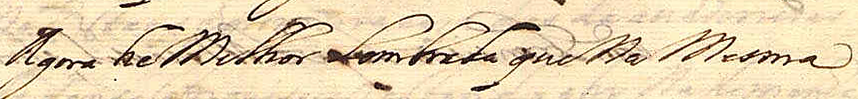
Agora he Melhor Lembrada que Na Mesma
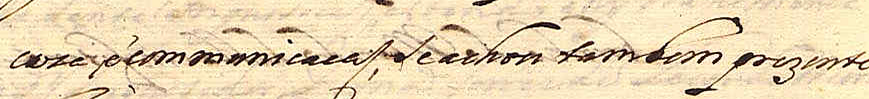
caza, e communicacaꝭ, se achou tambem prezente
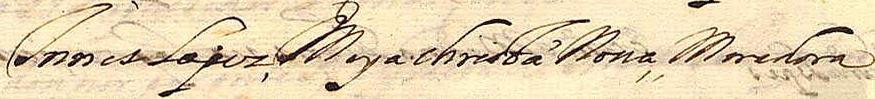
Innes Lopez, Meya christā Noua, Moradora
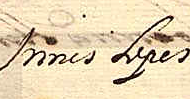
Jnnes Lopes
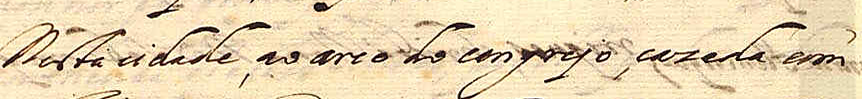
Nesta cidade, ao arco do congrejo, cazada com
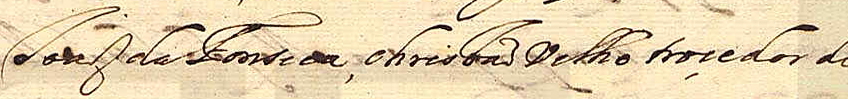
Ioaꝭ da Fonte, christaõ Velho troçedor de
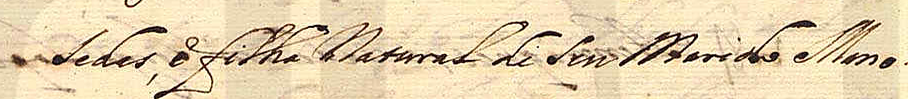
sedes, e filha NaturaL de seu Marido Mano
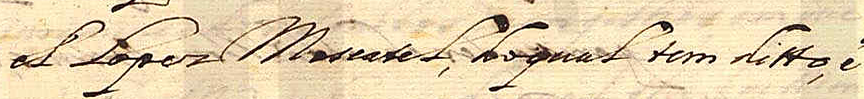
el Lopez MoscateL, do quaL tem ditto, e
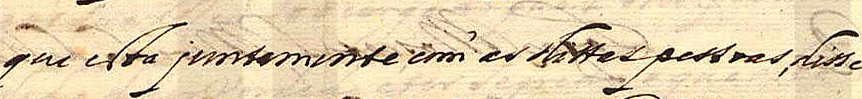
que esta juntamente com as dittas pessoas, disse
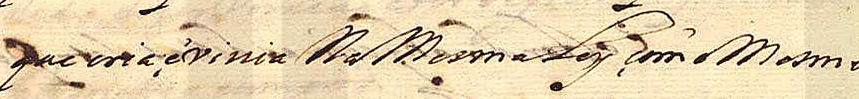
que cria, e viuia Na Mesma Ley, com o Mesmo
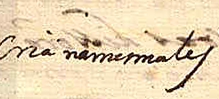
Cria na mesma lej
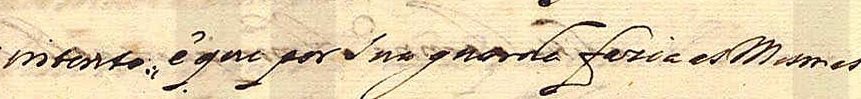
intento, e que por sua guarda fazia as Mesmas
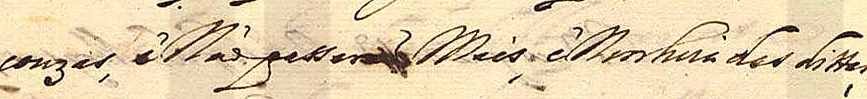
couzas, e Não passarā Mais, e Nenhuā das dittas
